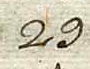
29
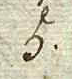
5.
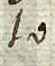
10
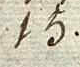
15.
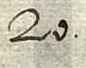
20.
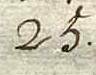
25.
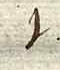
1
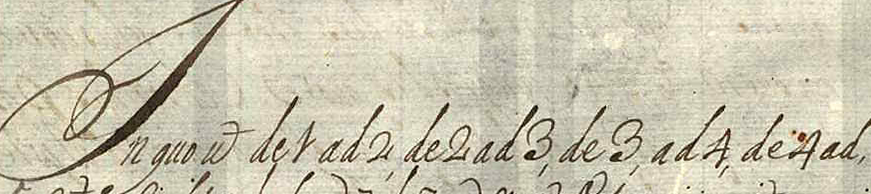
In quo ut de 1 ad 2, de 2 ad 3, de 3, ad 4, de 4 ad,
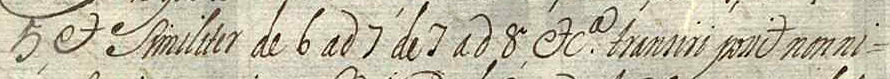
5, et Similiter de 6 ad 7 de 7 ad 8, etc.a transiri possit nonni
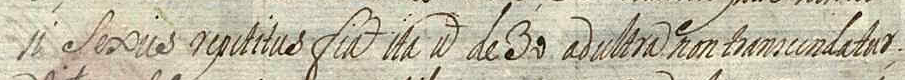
si Sexus repetitus fiat ita ut de 30 ad ultra non transcendatur,
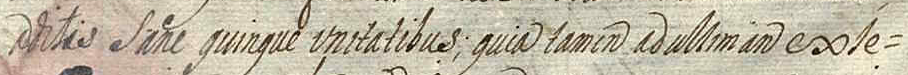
aditis Sane quinque vnitatibus; quia tamen ad ultiman ex se
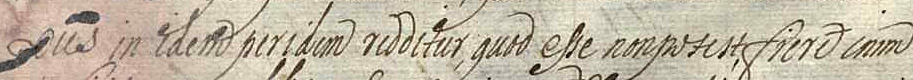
xus in idem peridem redditur, quod esse non potest, fieret enim
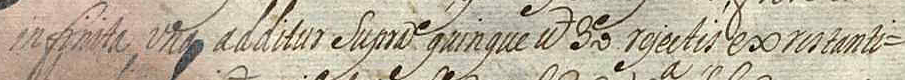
infinita vna additur Supra quinque ut 30 rejectis ex restanti
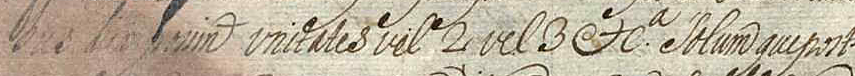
bus d__ possint vnitates vel 2 vel 3 etc.a Solumque post
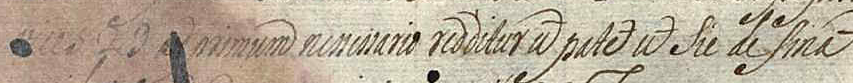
vices 29 _ primum nessessario redditur ut patet ut sic desinat
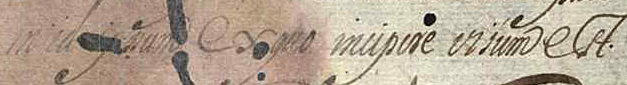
in id ipssum ex quo incipere visum est.
